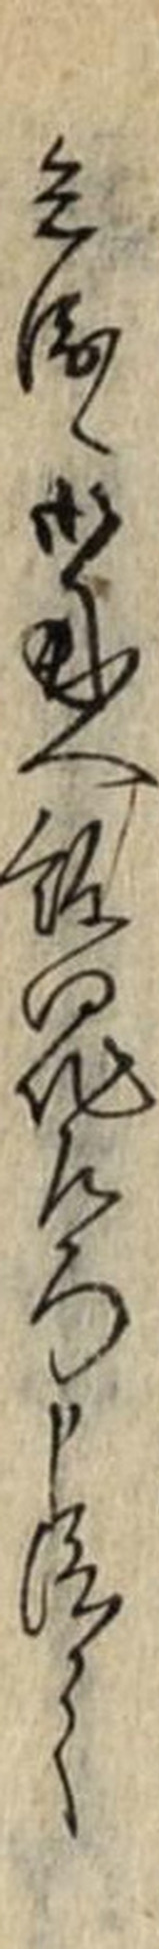兵衛へ御用人飯田作左衛門申渡之
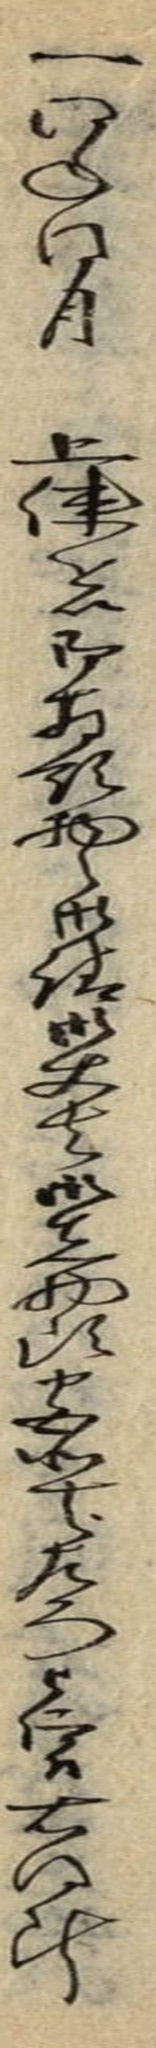一同年同月上使を以御拝領物之御請御使者御先物頭宮北十郎左衛門被仰付右同断
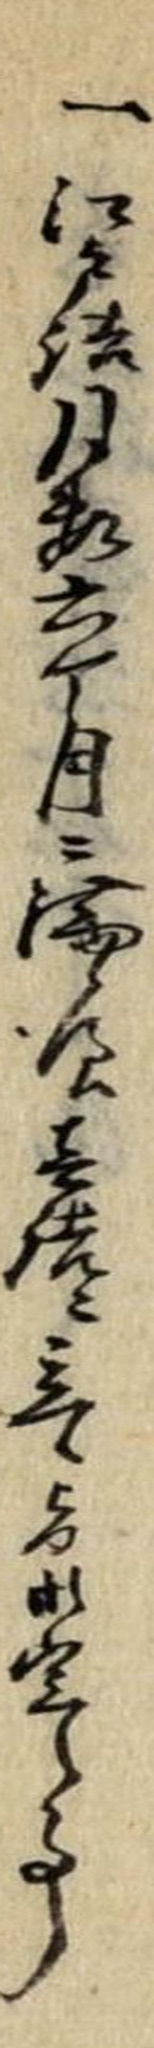一江戸詰月数六ヶ月に満候得は壱詰に立候旨御定之事
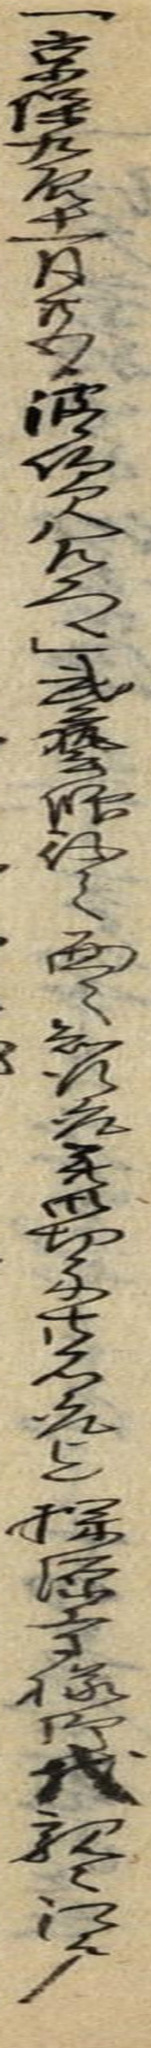一享保九辰十一月廿五日波々伯部八左衛門へ」武芸師役之面々知行取并御切米廿石取迄探源寺様御代親々江戸
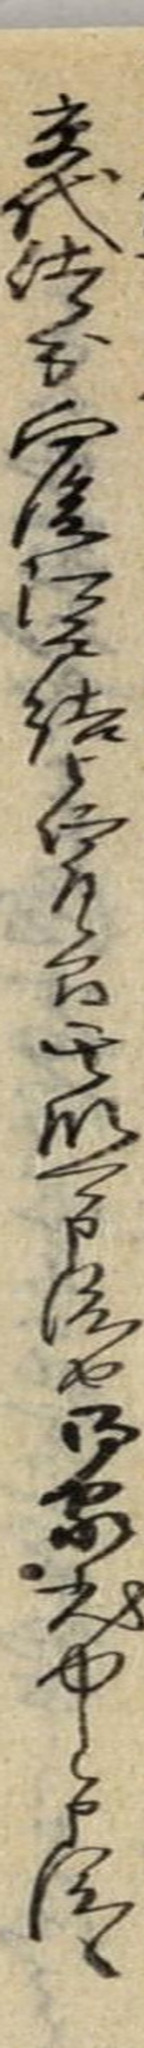交代仕候分向後江戸詰被仰付候間其段可申渡由御家老中被申渡候
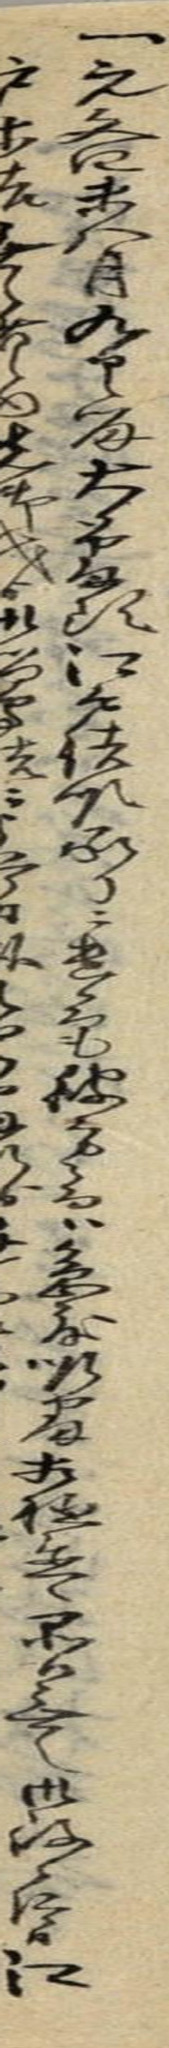一元文四未八月九日留大御番頭江戸詰順承りに遣候而も彼方に而は急度順番相極置候品は無之御役被仰付江
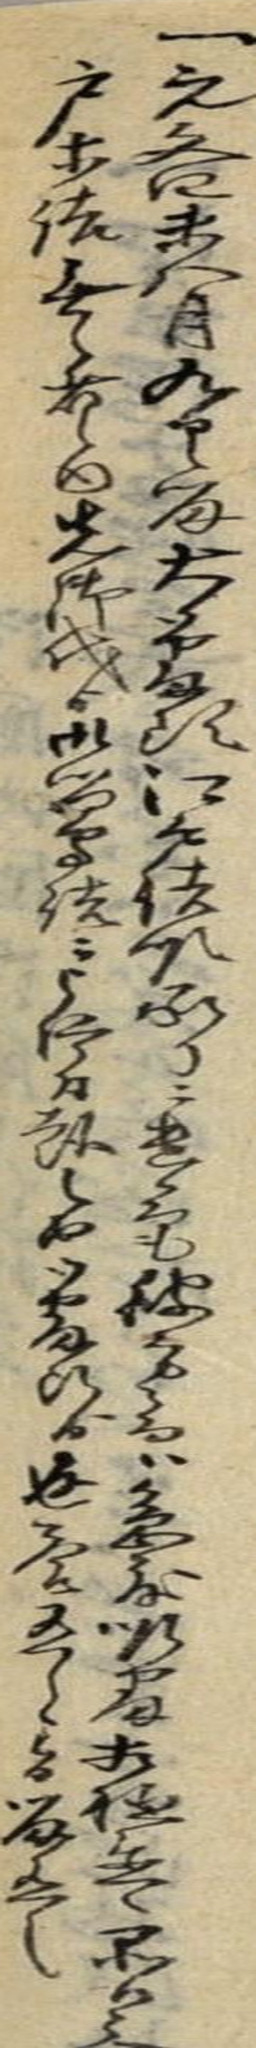戸等詰無之者之内先御代ゟ御留守詰に被仰付趣之由御番頭ゟ返答有之旨留有之
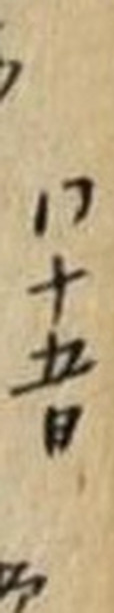同十五日
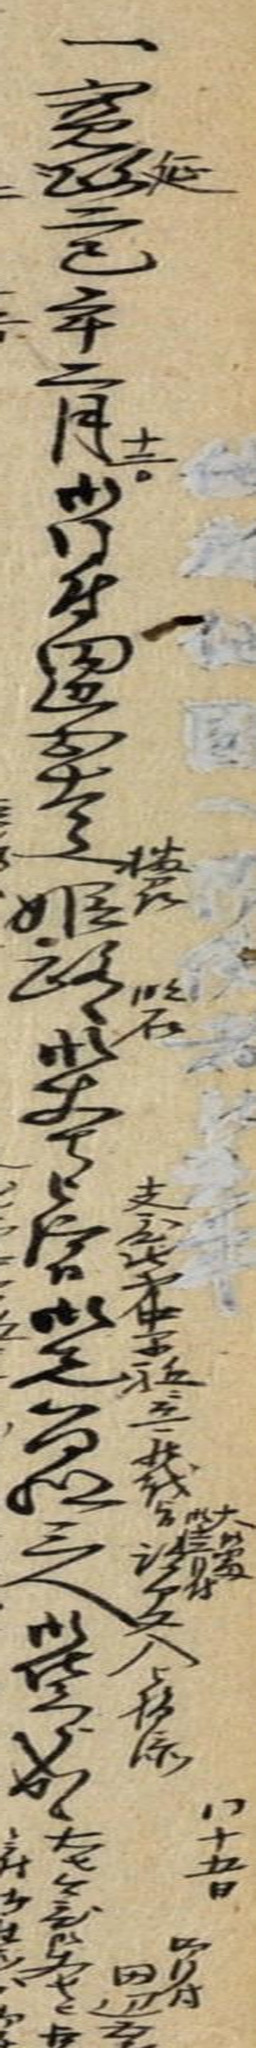一寛政二巳年二月十二日御目付田辺五太夫播州姫路明石へ御使者被仰付御先筒組三人御貸被成候
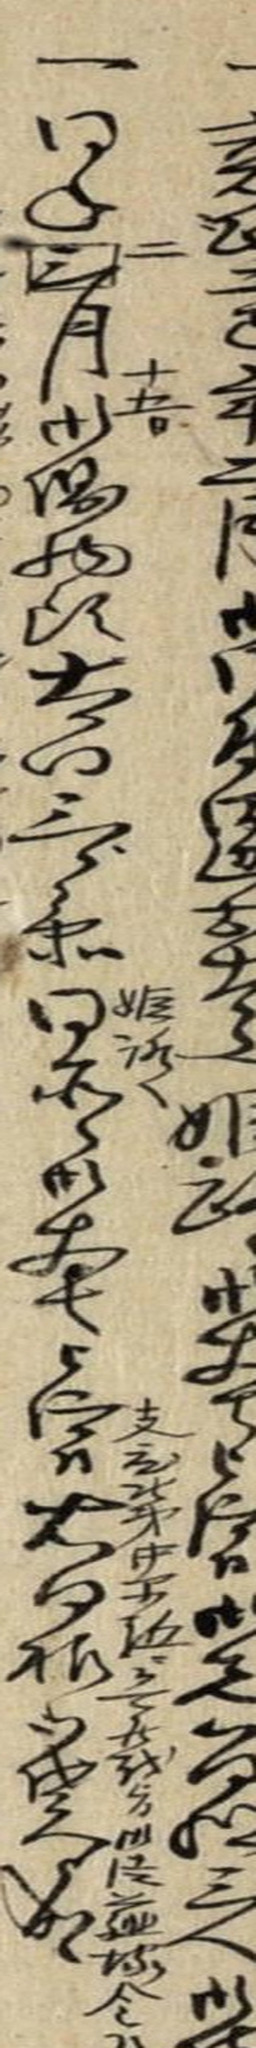一同年三月十五日御側物頭太田三郎兵衛同所姫路へ御使者被仰付右同様御貸被成候
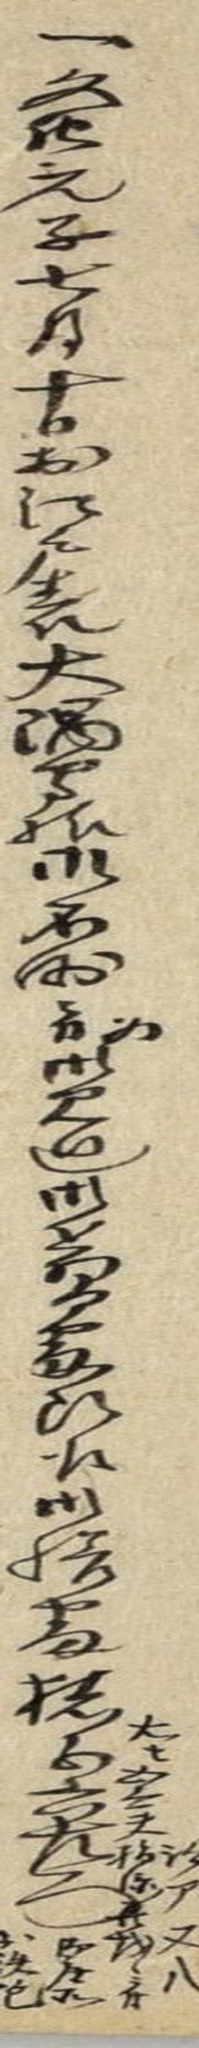一文化元子七月十日於江戸表大隅守様御不例に付為御見廻御近習番頭取御膳番猪子六左衛門
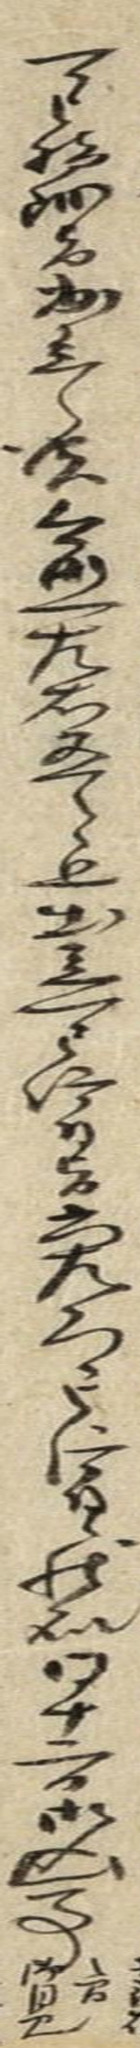可被指越旨出立之儀は今御一左右有之候上出立可被仰付旨六左衛門へ被仰付候然処同十二日御凶事
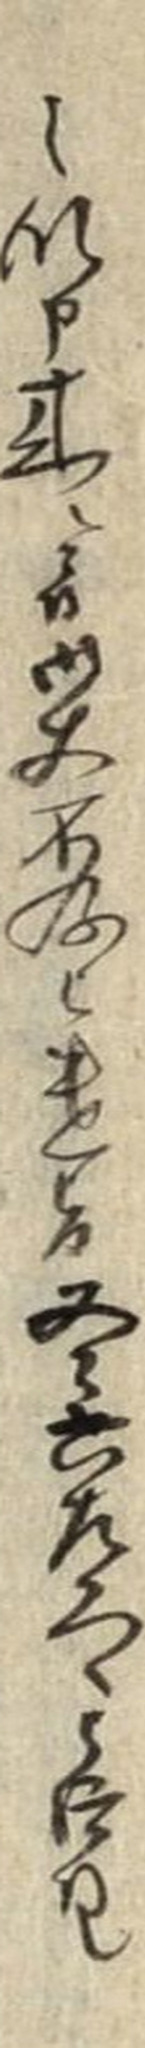之段申来候に付御使不及被遣旨又々六左衛門へ被仰付候
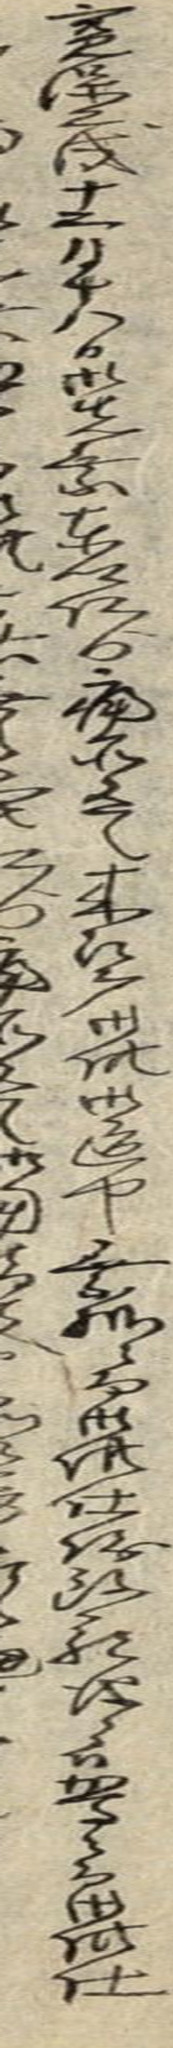一寛保二戌十二月十八日御先乗東郷仁右衛門痛所有之来江戸御供御道中乗掛に而御供仕儀致難儀候に付駕に而御供仕
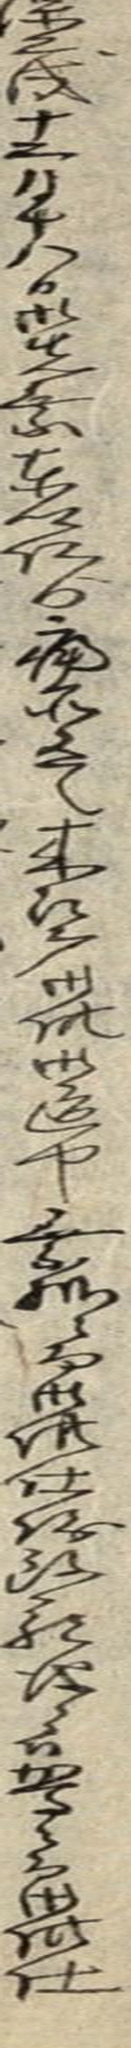一寛保二戌十二月十八日御先乗東郷仁右衛門痛所有之来江戸御供御道中乗掛に而御供仕儀致難儀候に付駕に而御供仕
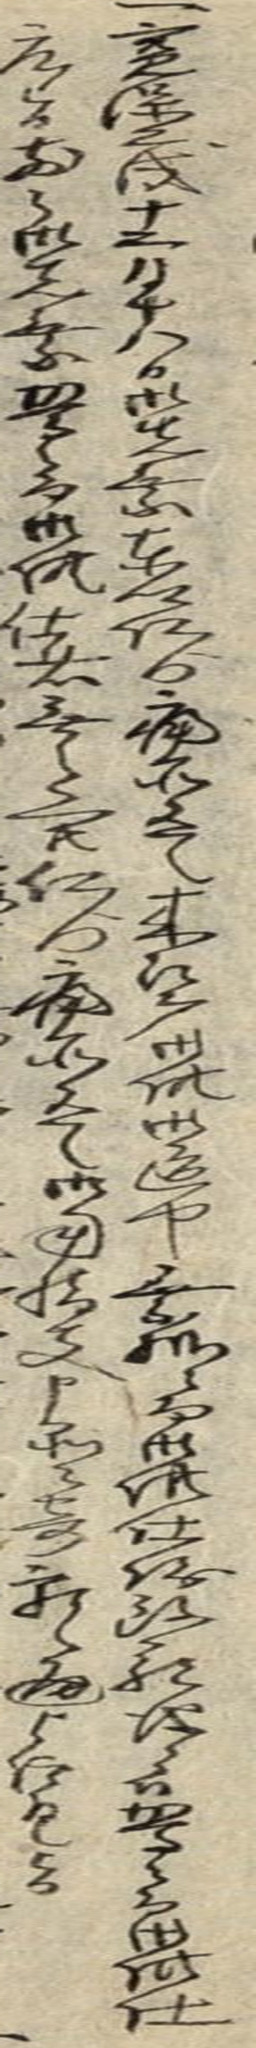度旨前々御先乗駕に而御供仕候者無之候へ共仁右衛門痛所有之御用指支申品に寄願之通被仰付候旨
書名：御用并被仰出之部
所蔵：福井県文書館 Fukui Prefectural Archives
